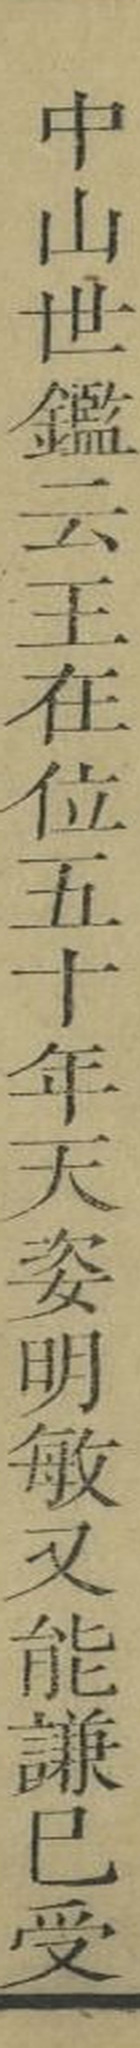中山世鑑云王在位五十年天姿明敏又能謙巳受
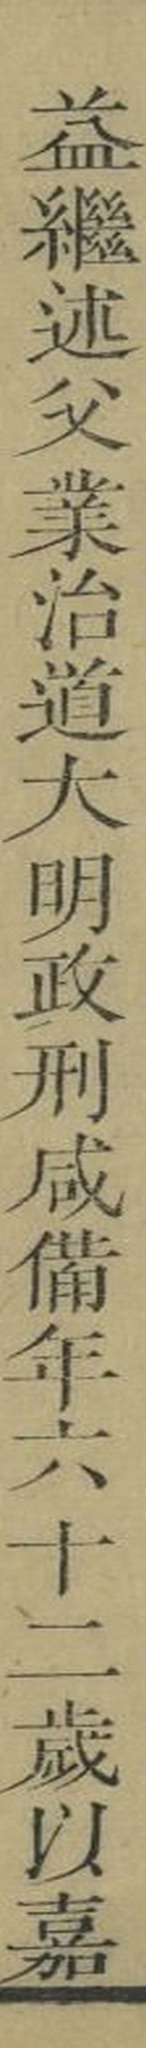益継述父業治道大明政刑咸備年六十二歳以嘉
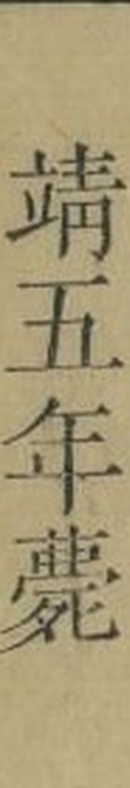靖五年薨

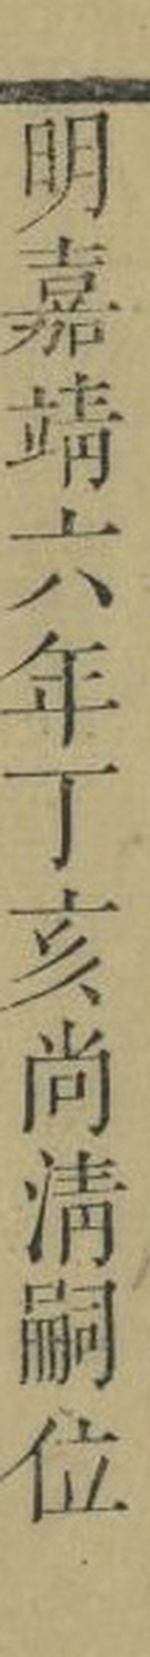明嘉靖六年丁亥尚清嗣位
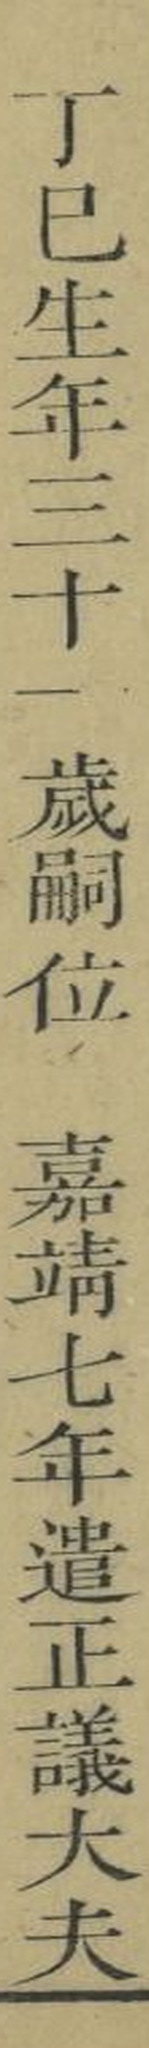丁巳生年三十一歳嗣位嘉靖七年遣正議大夫
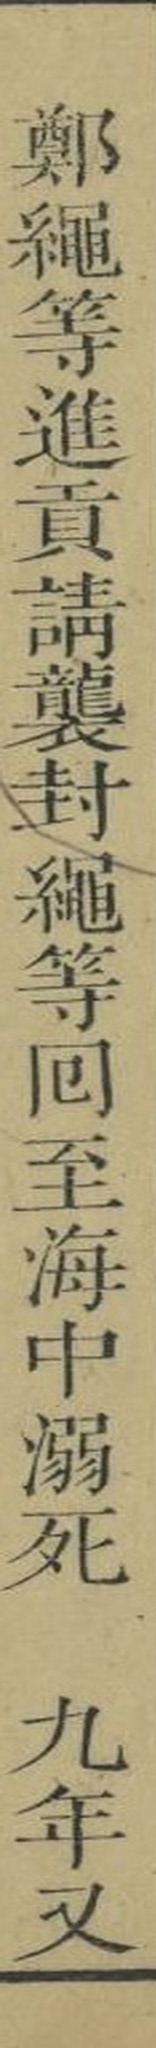鄭縄等進貢請襲封縄等回至海中溺死九年又
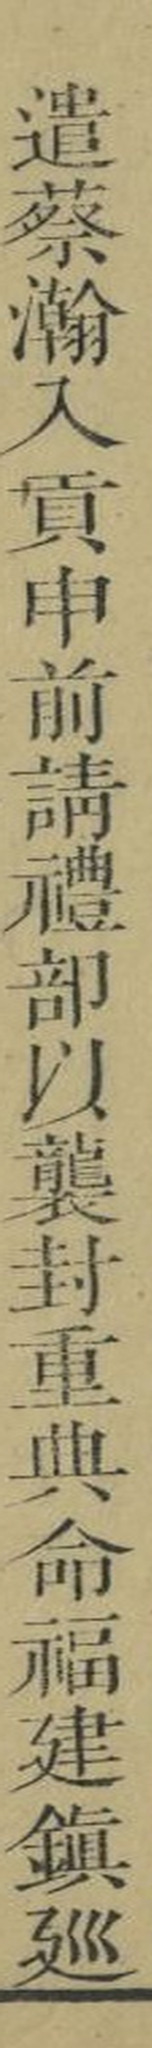遣蔡瀚入貢申前請礼部以襲封重典命福建鎮巡
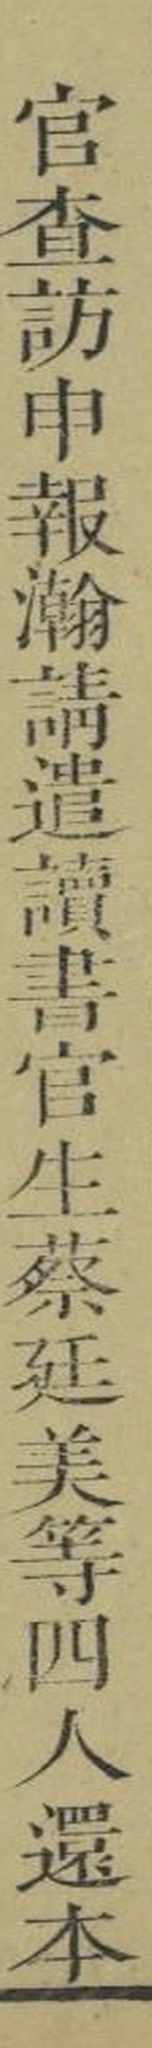官査訪申報瀚請遣読書官生蔡廷美等四人還本
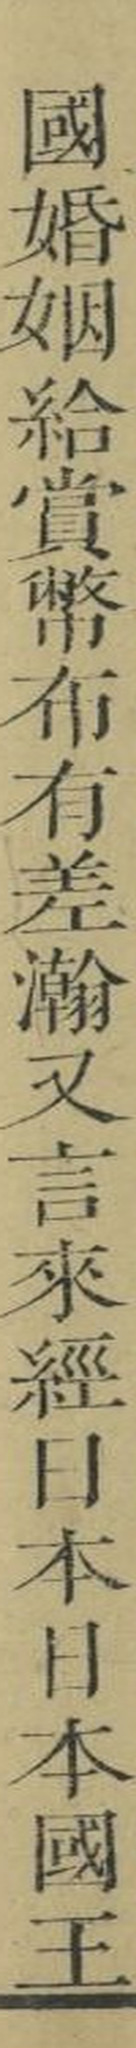国婚姻給賞幣布有差瀚又言来経日本日本国王
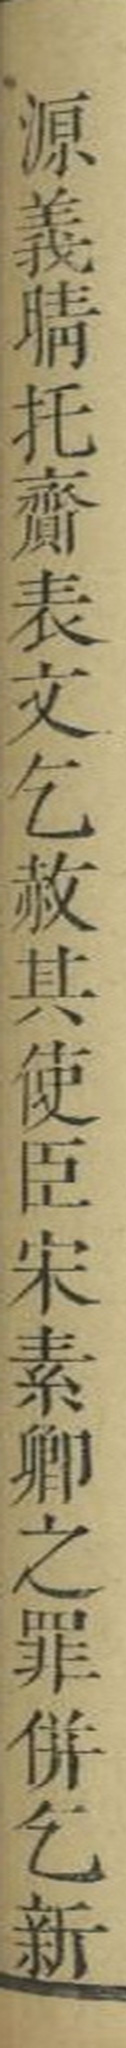源義晴托齎表文乞赦其使臣宋素卿之罪併乞新
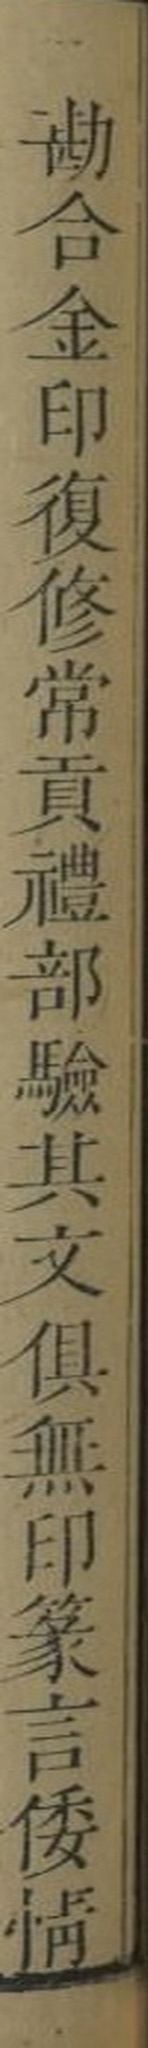勘合金印復修常貢礼部験其文俱無印篆言倭情
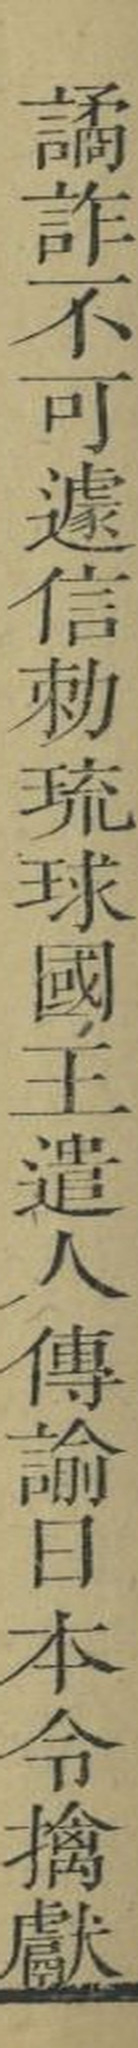譎詐不可遽信勅琉球国王遣人伝諭日本令擒献
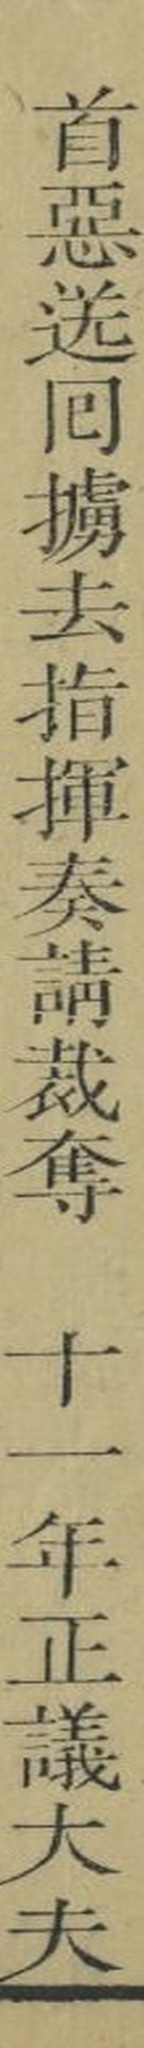首悪送回擄去指揮奏請裁奪十一年正議大夫
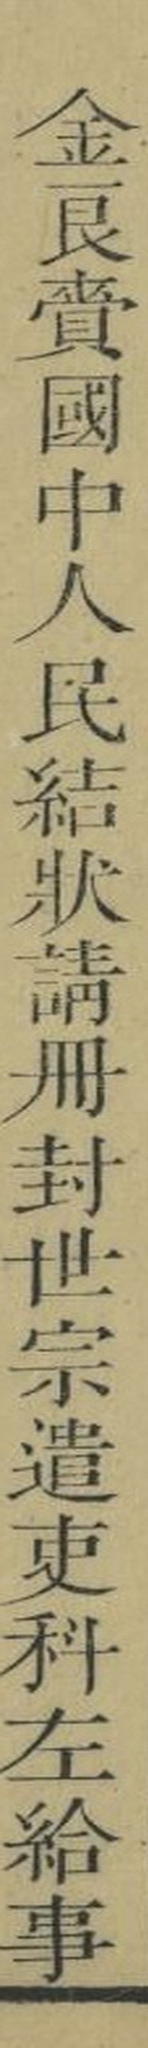金良賚国中人民結状請冊封世宗遣吏科左給事
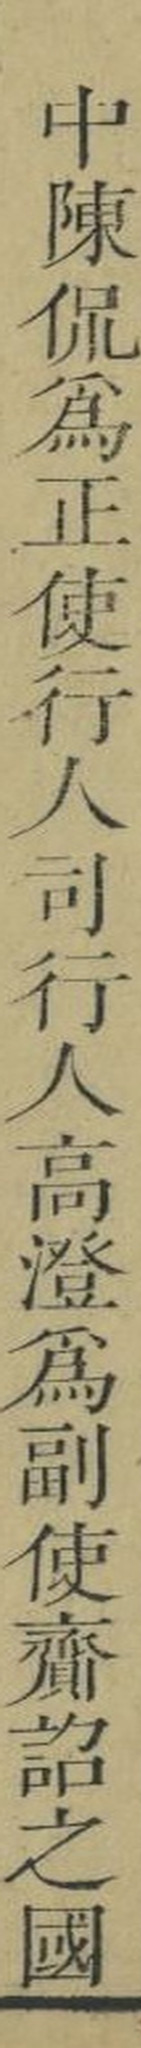中陳侃為正使行人司行人高澄為副使齎詔之国
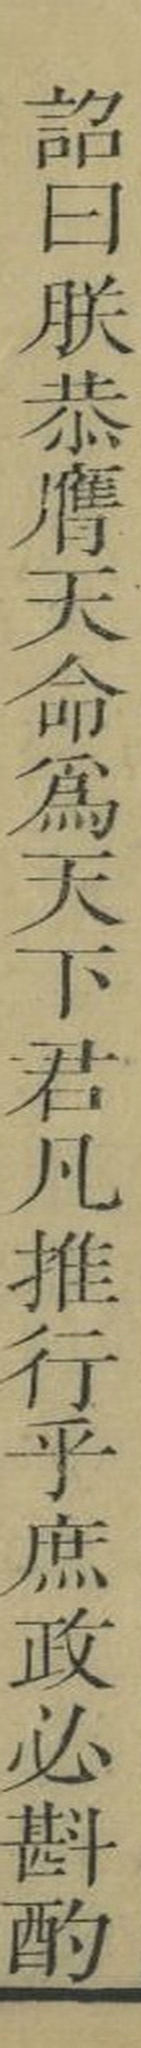詔曰朕恭膺天命為天下君凡推行乎庶政必斟酌
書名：中山伝信録 巻三
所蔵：University of the Ryukyus Library
